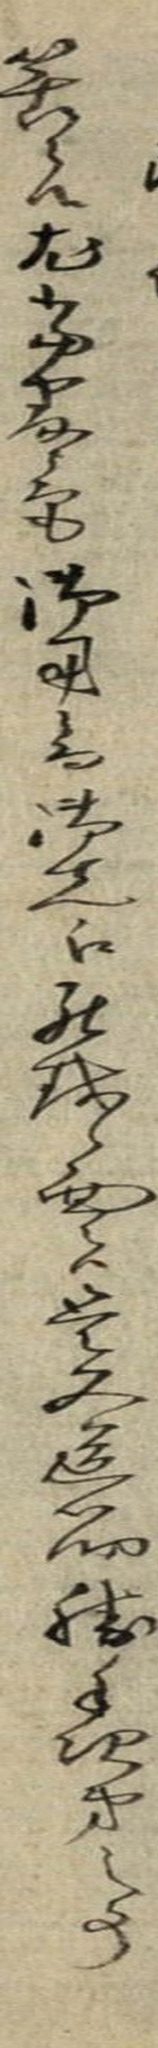筈に候尤当番にても御用にて御先江罷越候面々は是又道筋勝手次第之事
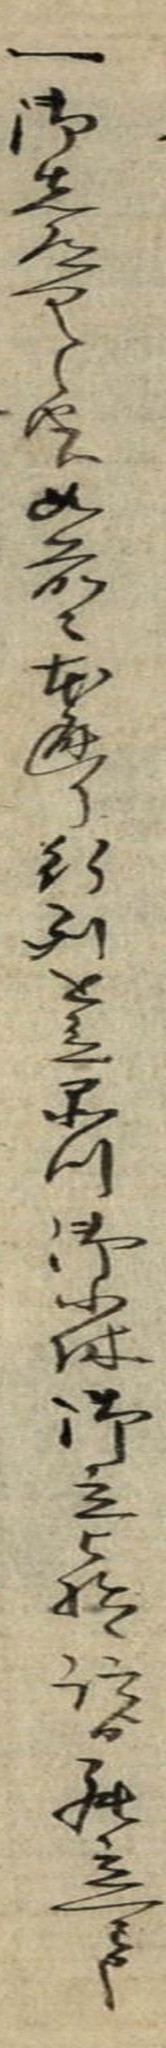一御先道具之儀は如前々本通り行列を立品川御小休御立被遊候跡ゟ罷立可被申
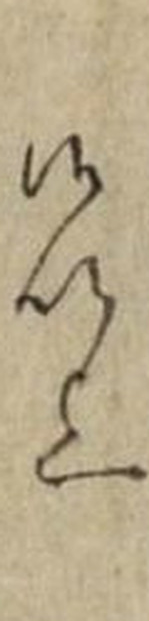候以上
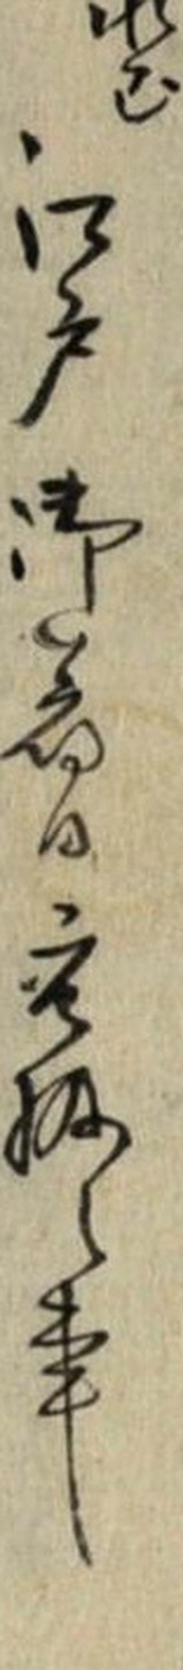江戸御着日取扱之事
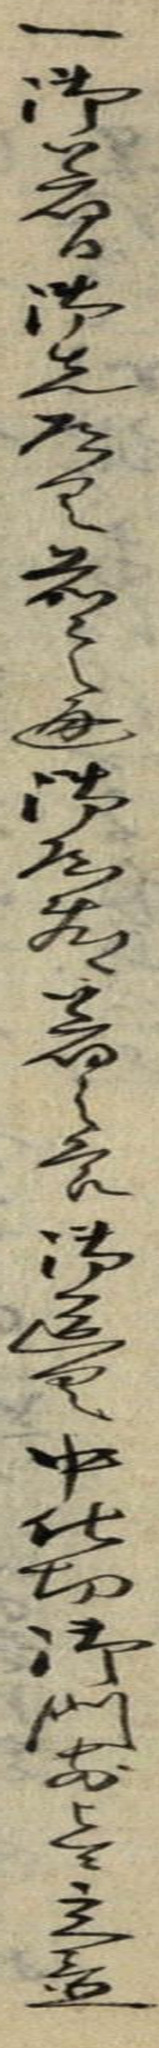一御着日御先道具前々之通御屋敷へ着之節御道具中仕切御門前迄に立置
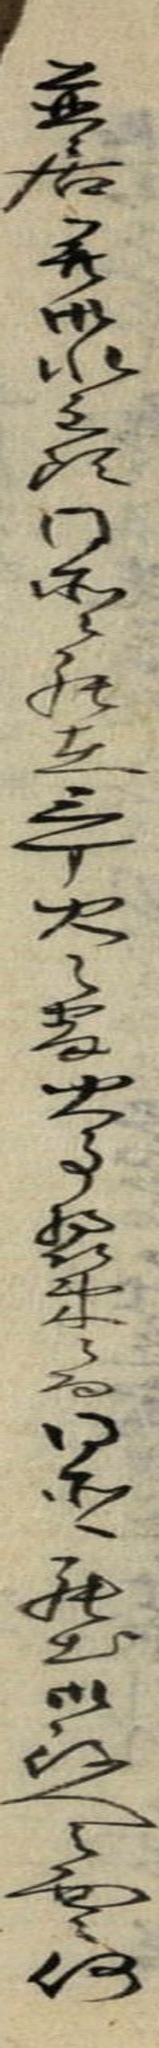並居并御水主頭同所に罷在三丁火之番火事装束にて同所へ罷出御役人之面々何
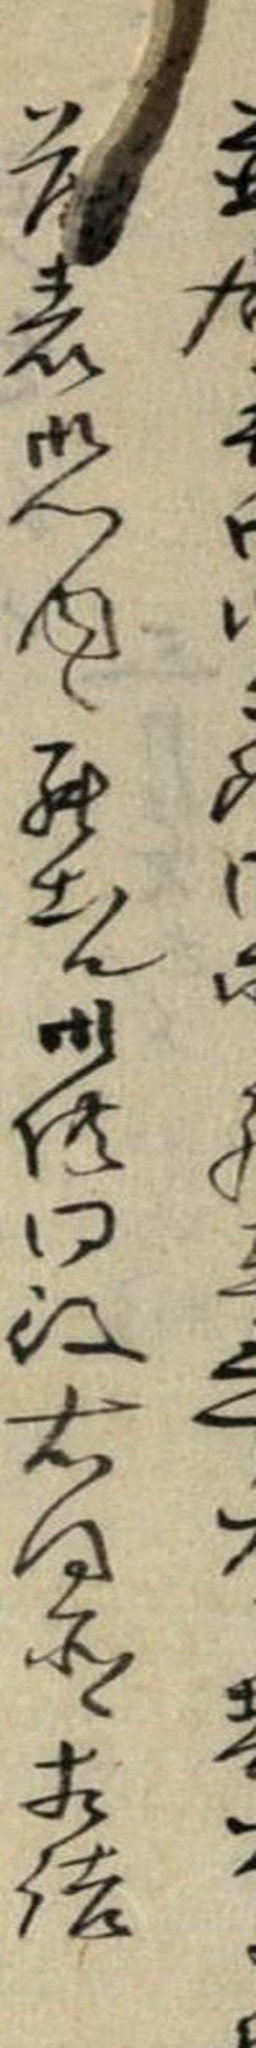も表御門内へ罷出る御供同役右同所へ相詰
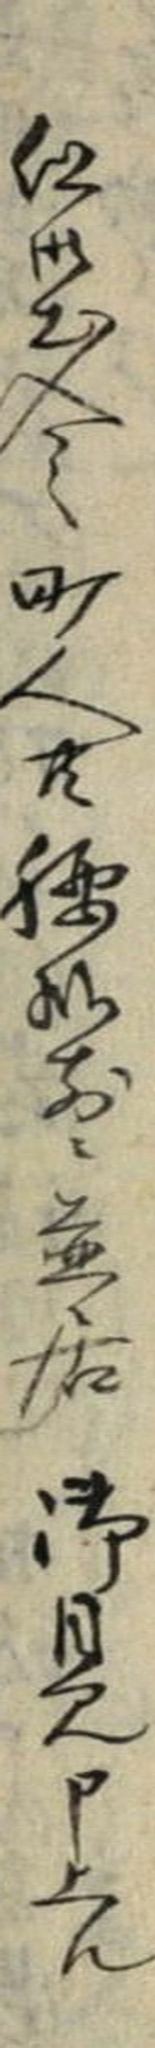但御出入之町人共腰掛前に並居御目見申上る
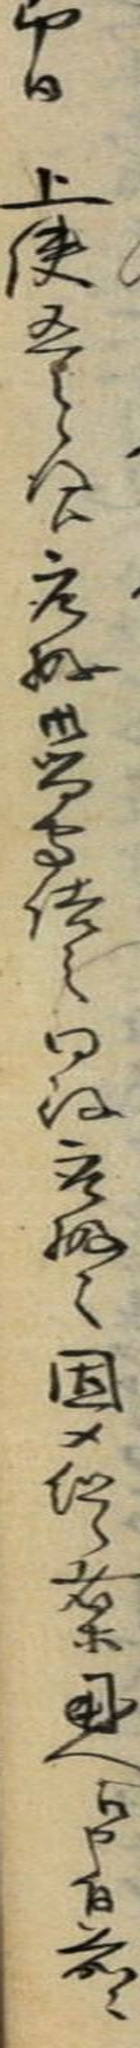一即日上使有之候得は取扱御留守詰之同役取扱之固め組之者等用人江申付前々
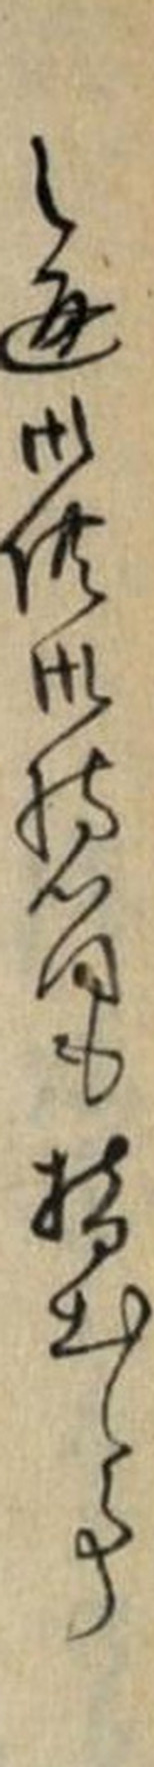之通御供御持筒も指出之事
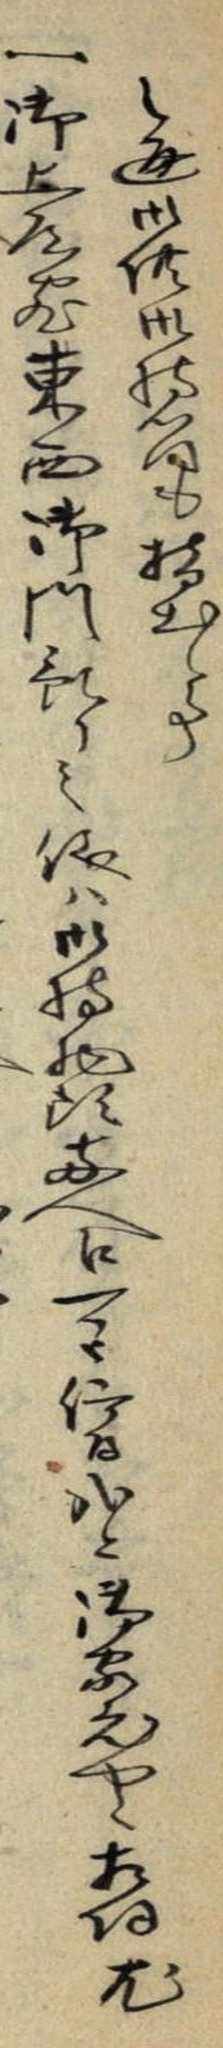一御上屋敷東西御門預り之儀は御持物頭両人江可被仰付哉と御家老中へ相伺尤
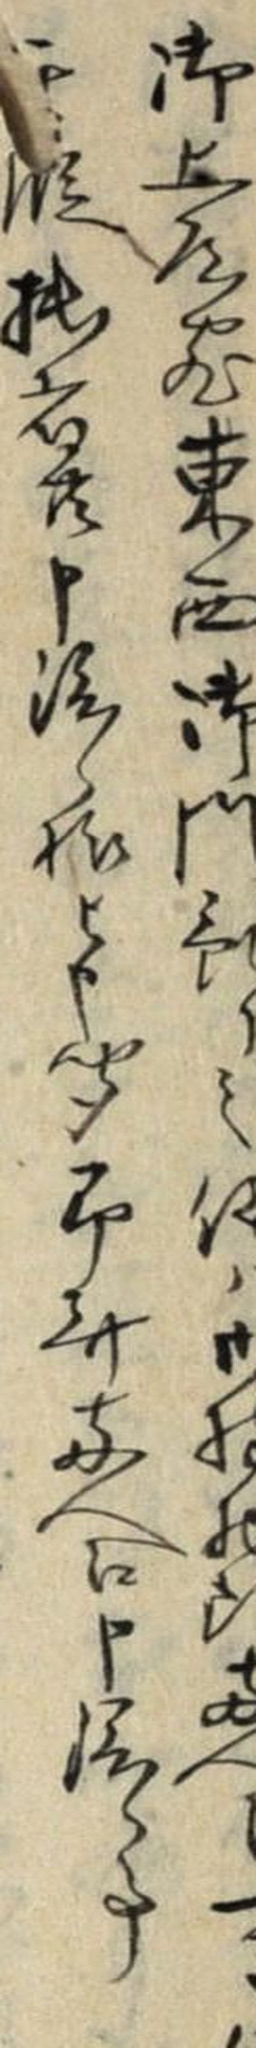其段拙者共申渡候様被申聞即刻両人江申渡候事
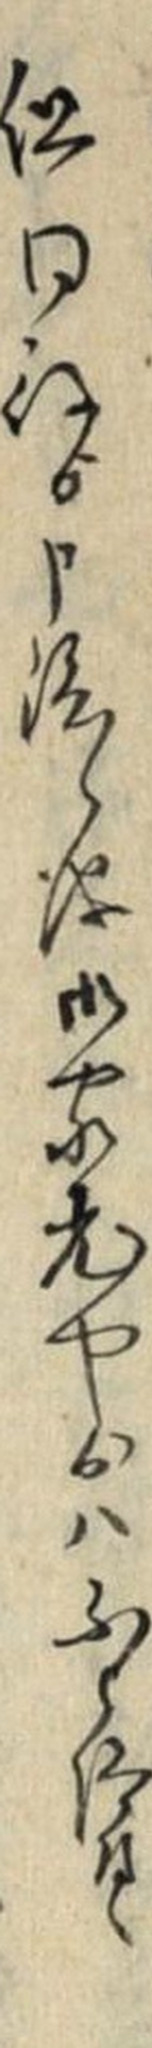但同役ゟ申渡候儀御家老中ゟは不被仰付候
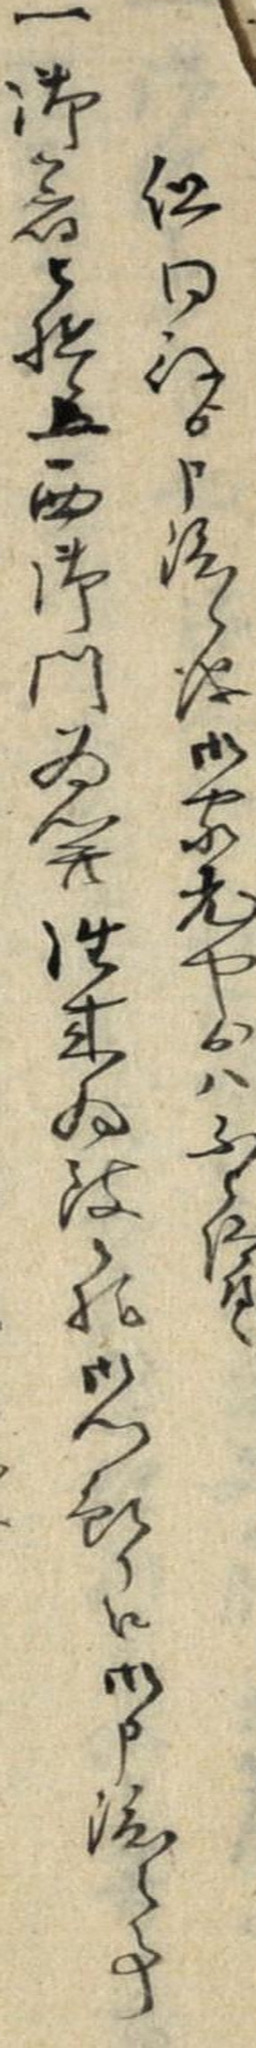一御着被遊候上西御門為開往来為致候様御門預り江御申渡之事
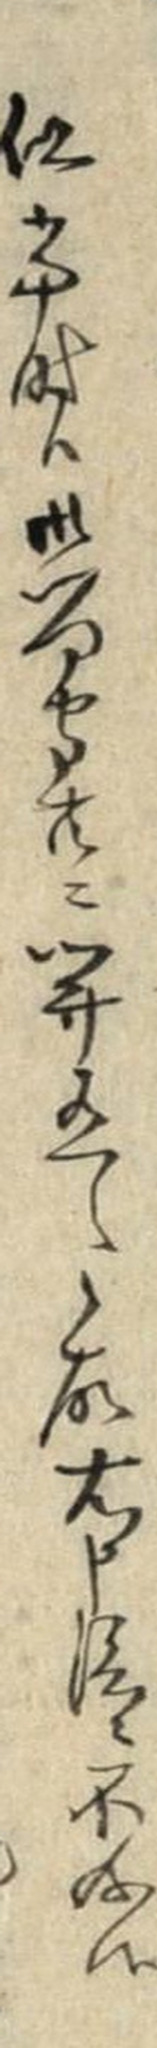但当時は御留守共に開有之候故右申渡に不及候
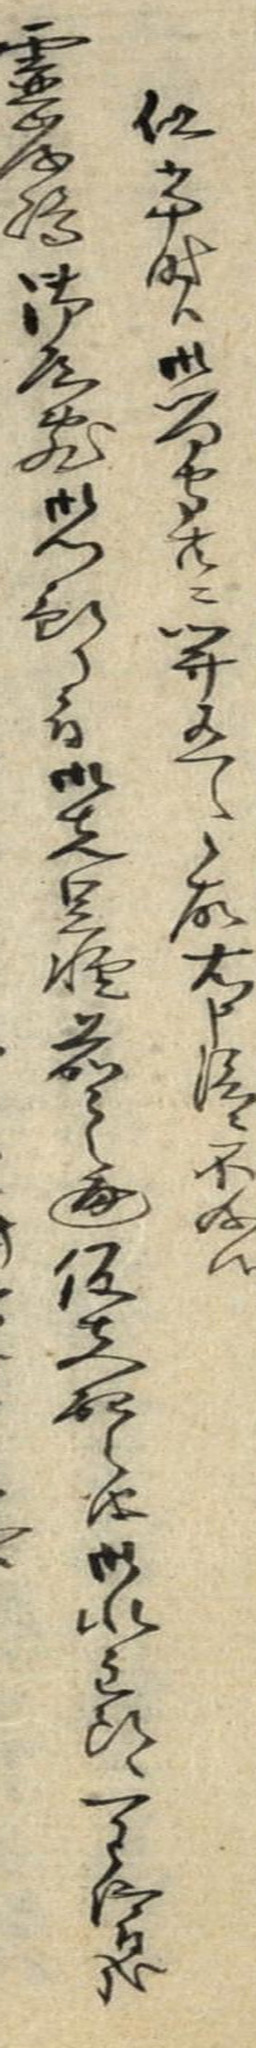一霊岸嶋御屋敷御門預りに付御先足軽前々之通仮支配之儀御水主頭へ可被仰付候哉
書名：三都并道中之部
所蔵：福井県文書館 Fukui Prefectural Archives
